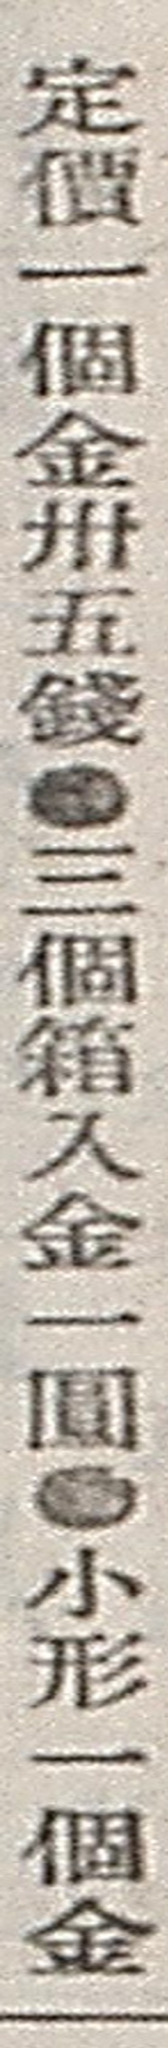定価一個金卅五銭●三個箱入金一円●小形一個金
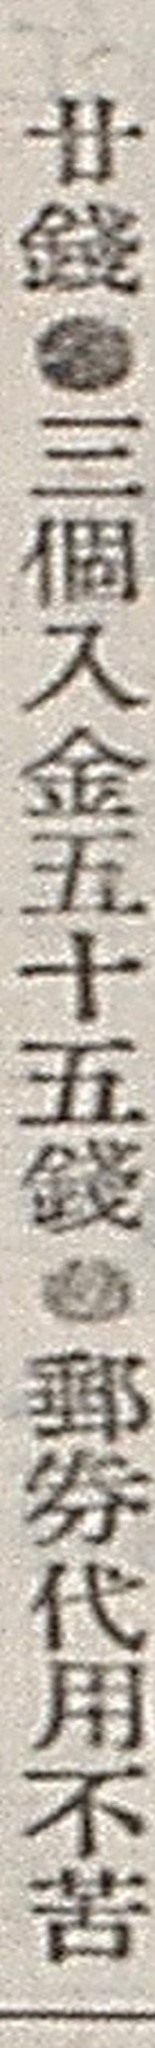廿銭●三個入金五十五銭●郵券代用不苦
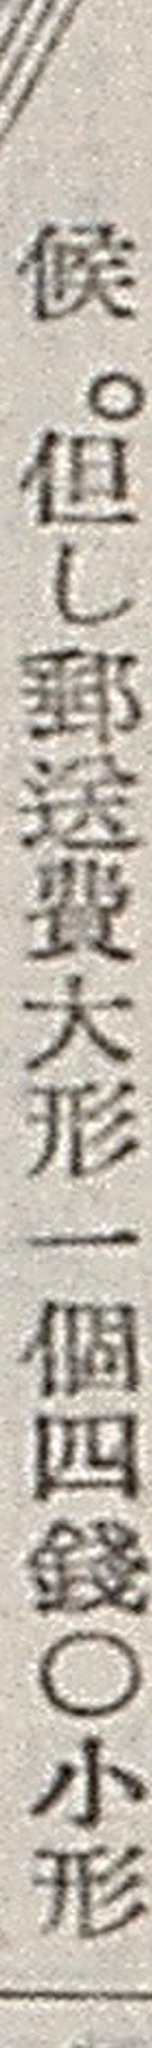候。但し郵送費大形一個四銭〇小形
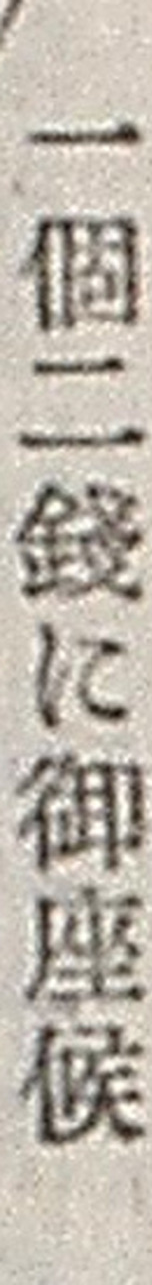一個二銭に御座候
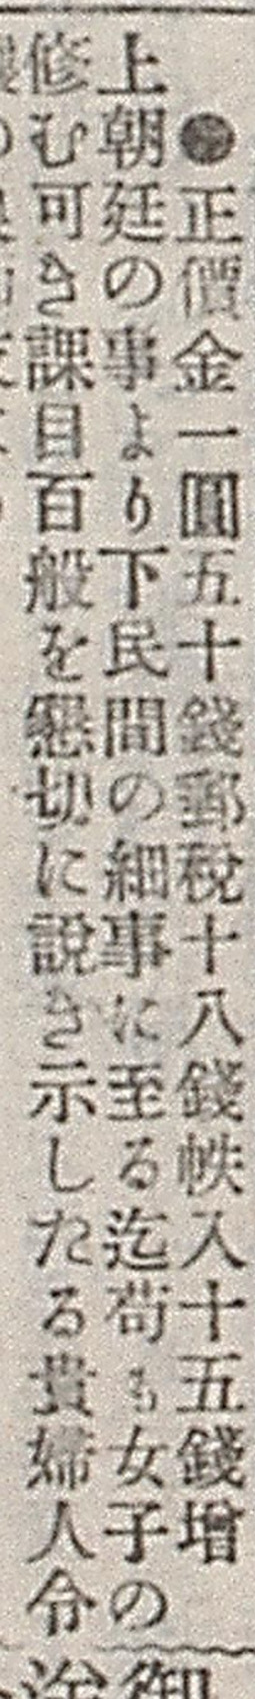修む可き課目百般を懇切に説き示したる貴婦人令
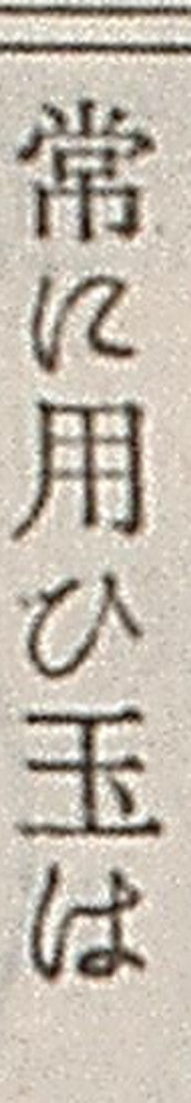常に用ひ玉は
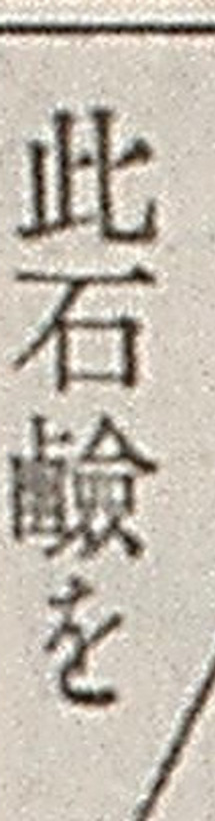此石鹸を
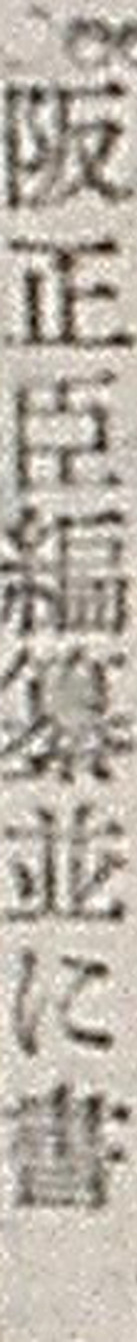阪正臣編纂並に書
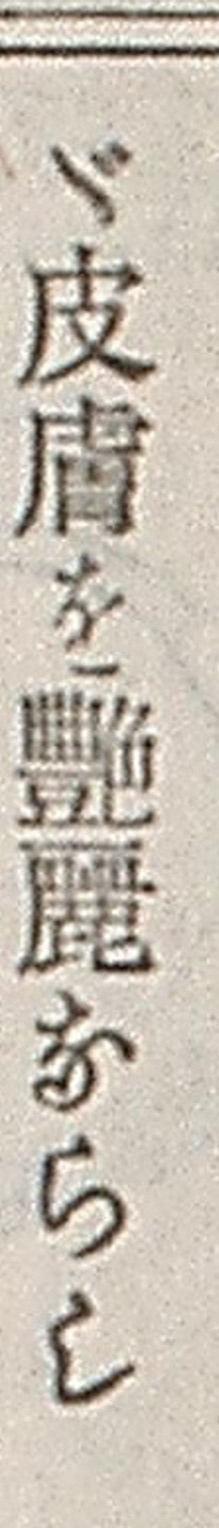ゞ皮膚を艶麗ならし
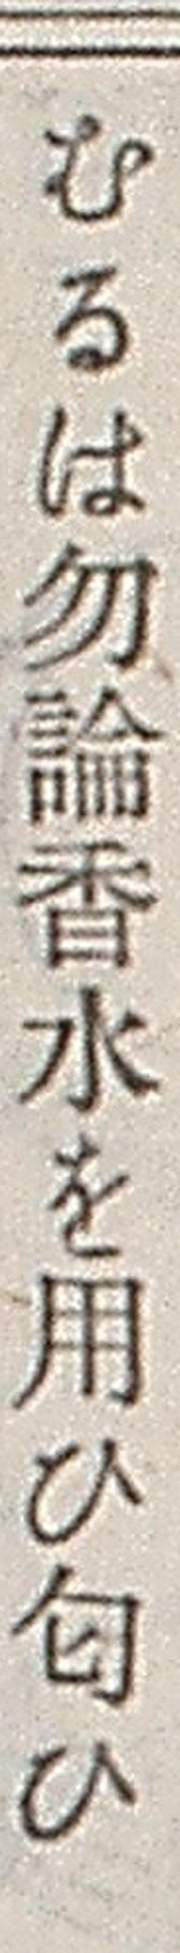むるは勿論香水を用ひ匂ひ
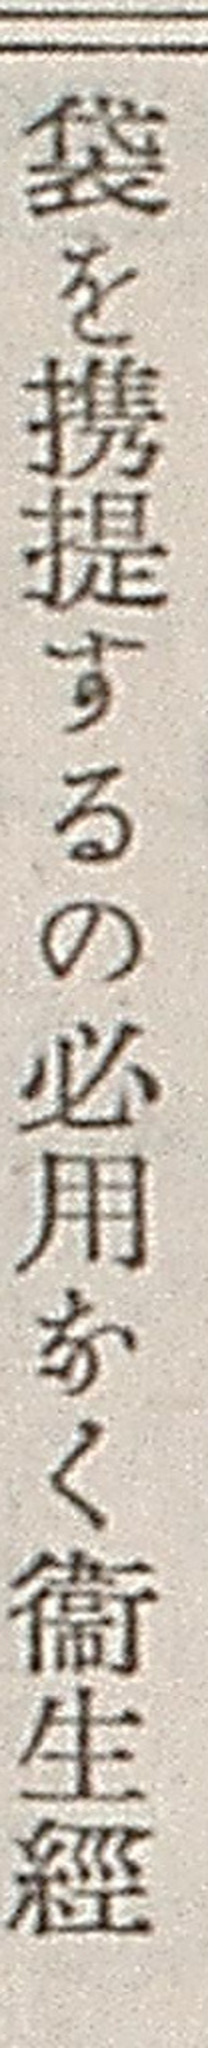袋を携提するの必要なく衛生経
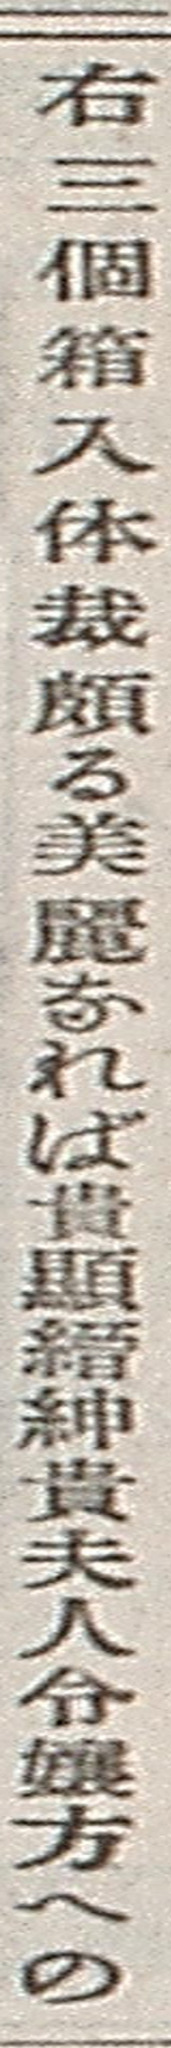右三個箱入体裁頗る美麗なれば貴顕縉紳貴夫人令嬢方への
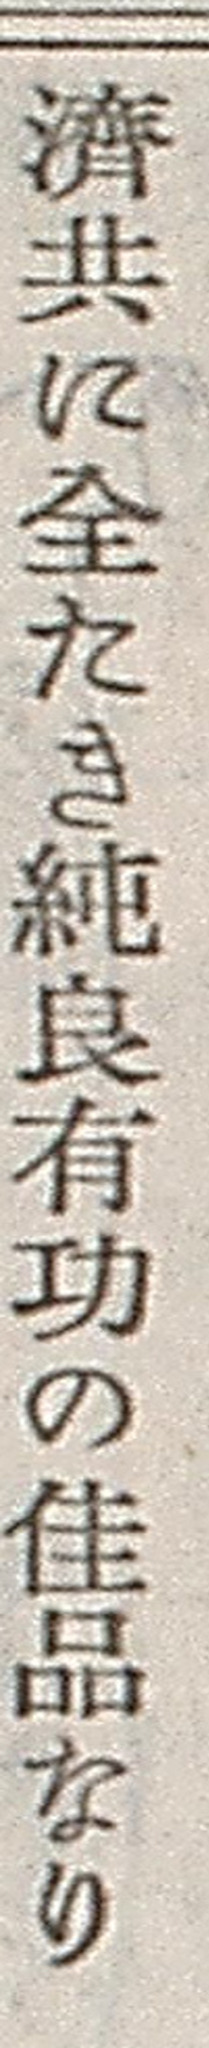済共に全たき純良有功の佳品なり
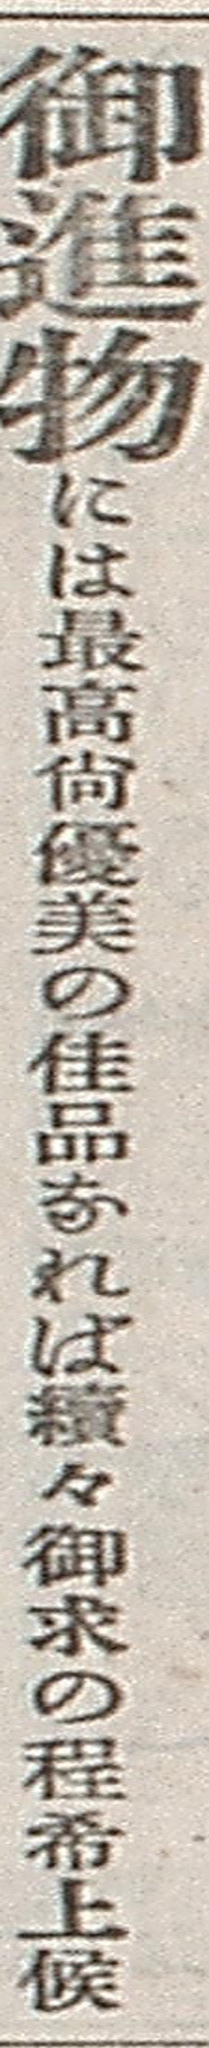御進物には最高尚優美の佳品なれば続々御求の程希上候
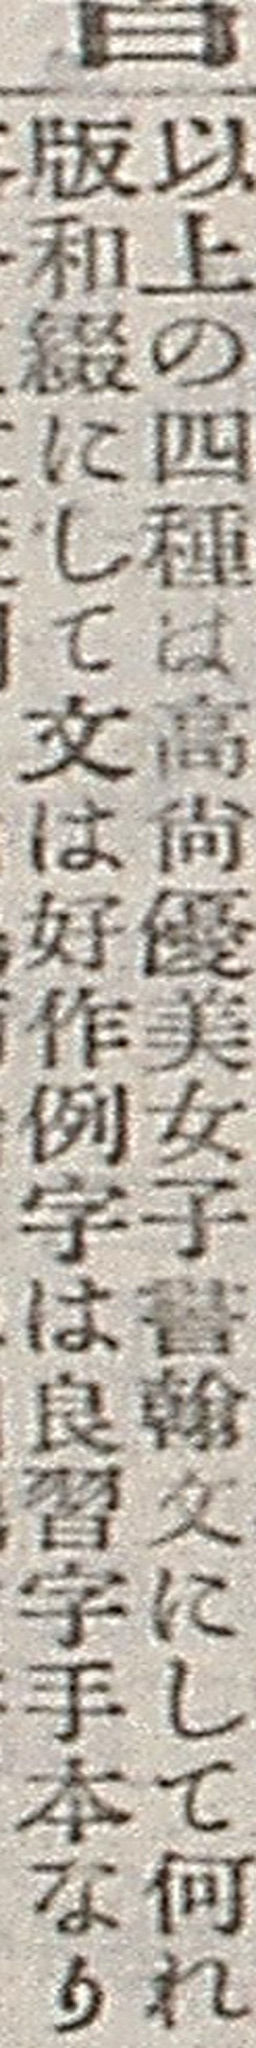版綴にして文は好作例字は良習字手本なり
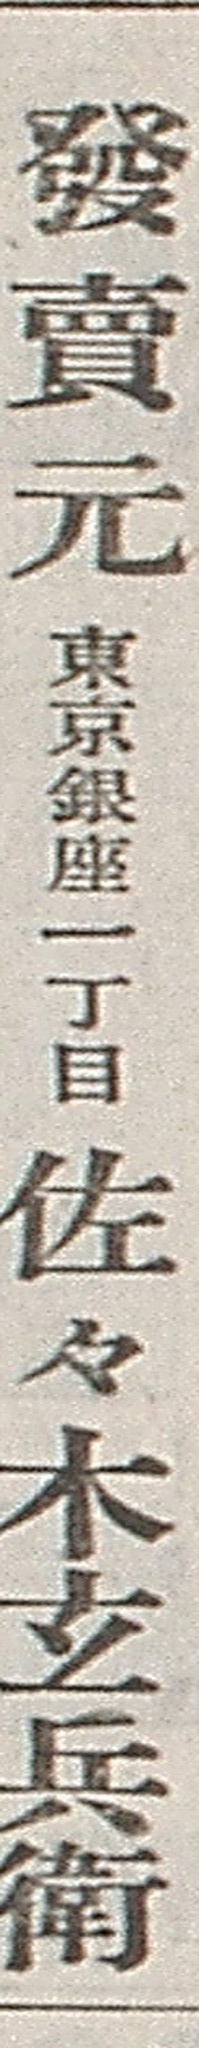発売元東京銀座一丁目佐々木玄兵衛
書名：風俗畫報臨時増刊第百二十四號　洪水地震被害録（上）
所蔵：東京大学地震研究所図書室 Earthquake Research Institute Library, The University of Tokyo, JAPAN
